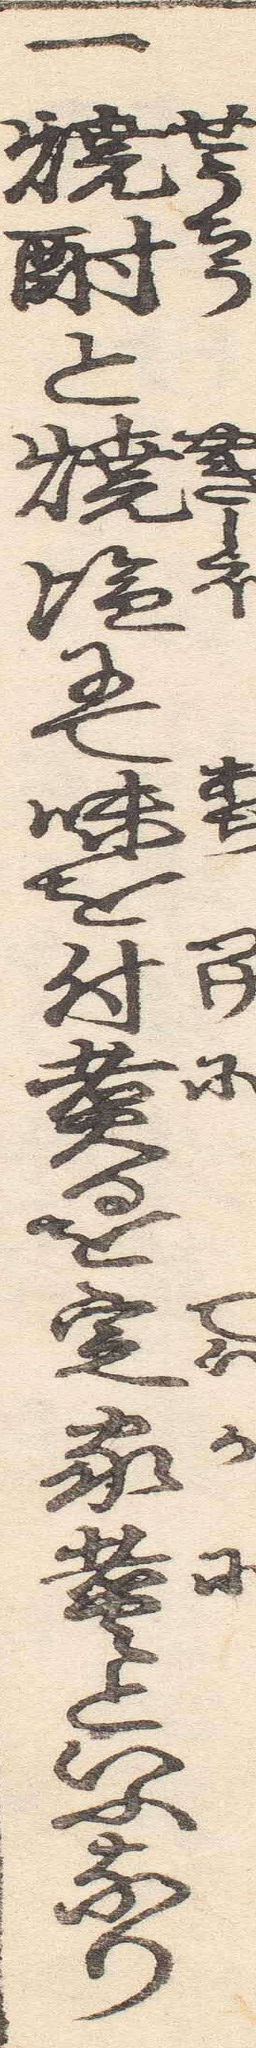一焼酎と焼塩にて味を付煮るを定家煮といふなり
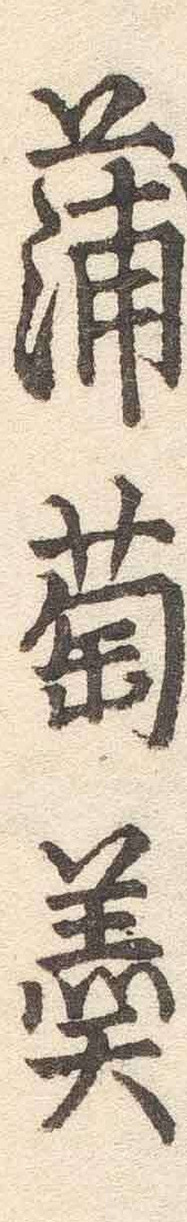蒲萄羹
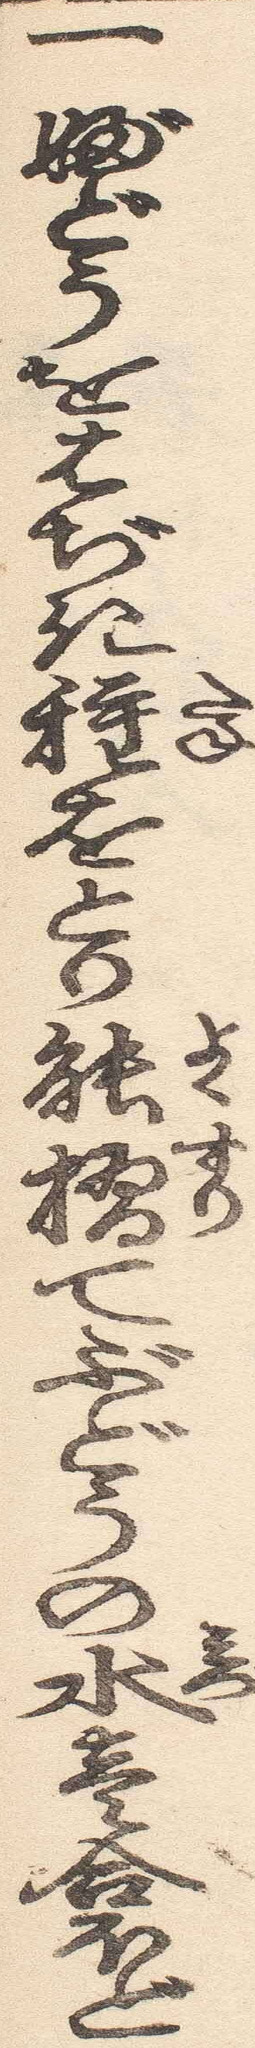一ぶどうをはぢき種をとり能摺てぶどうの水壱合ほど
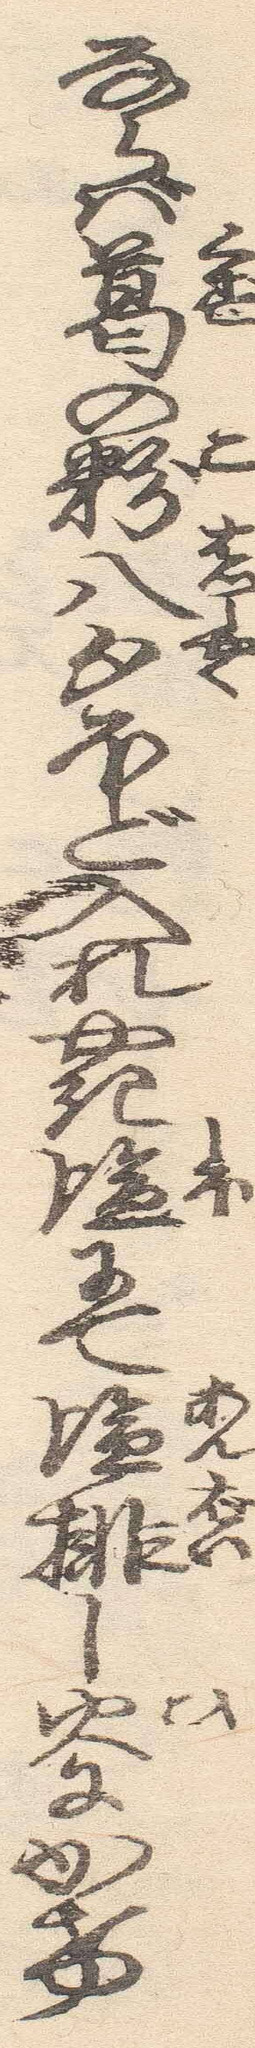ならば葛の粉八勺ほど入れやき塩にて塩排し火にかけ
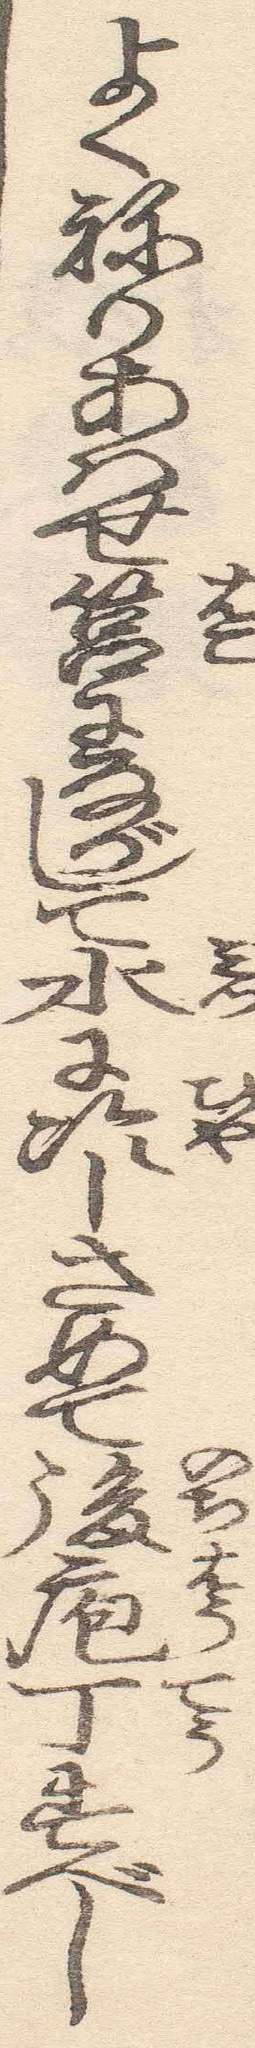よくねりあわせ筥にながして水に冷しさめて後庖丁すべし
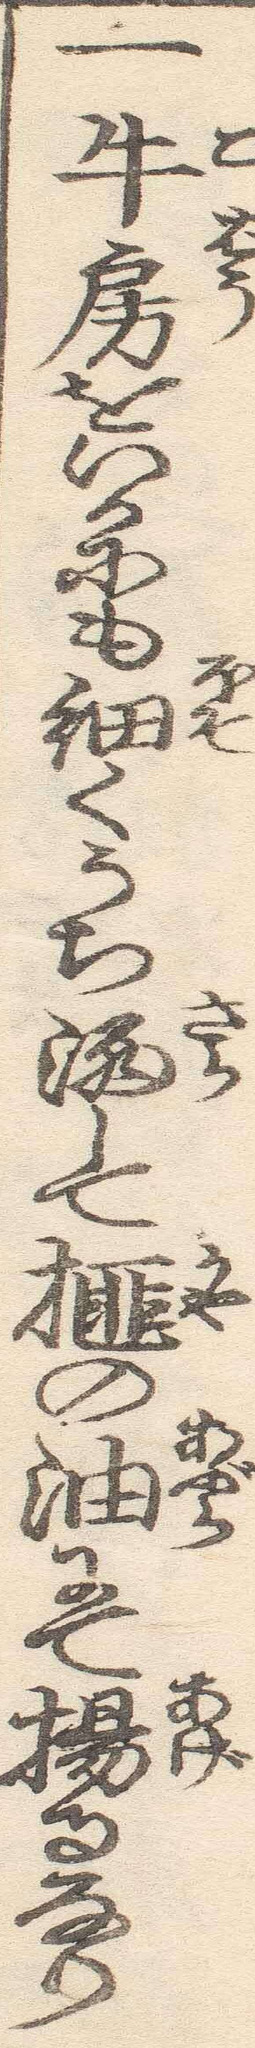一牛房をいかにも細くうち洒して榧の油にて揚るなり
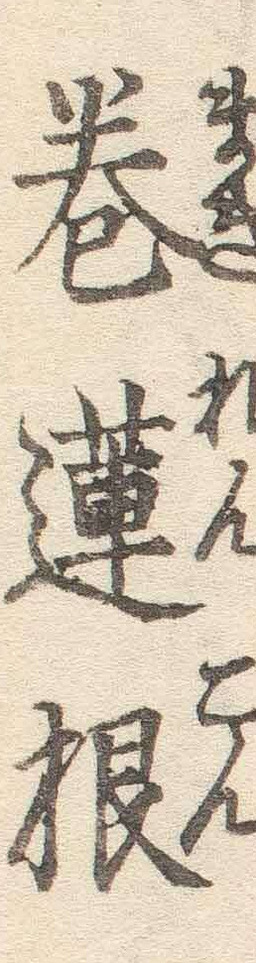巻蓮根
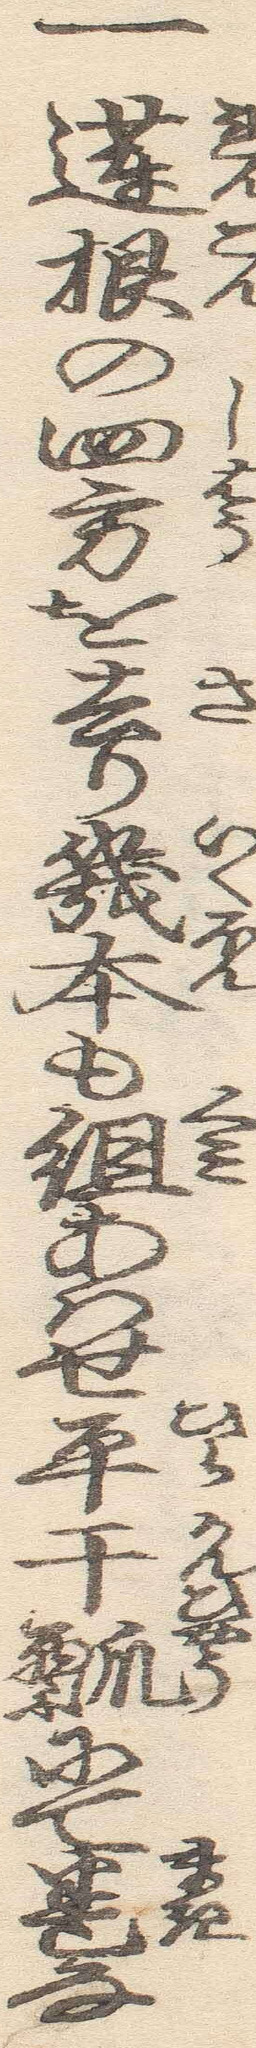一蓮根の四方を去り幾本も組あはせ平干瓢にて巻な
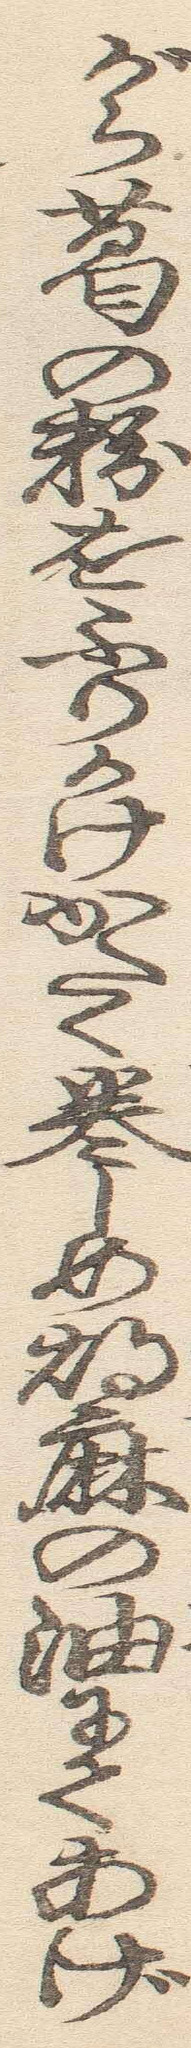がら葛の粉をふりかけかたく巻しめ胡麻の油にてあげ
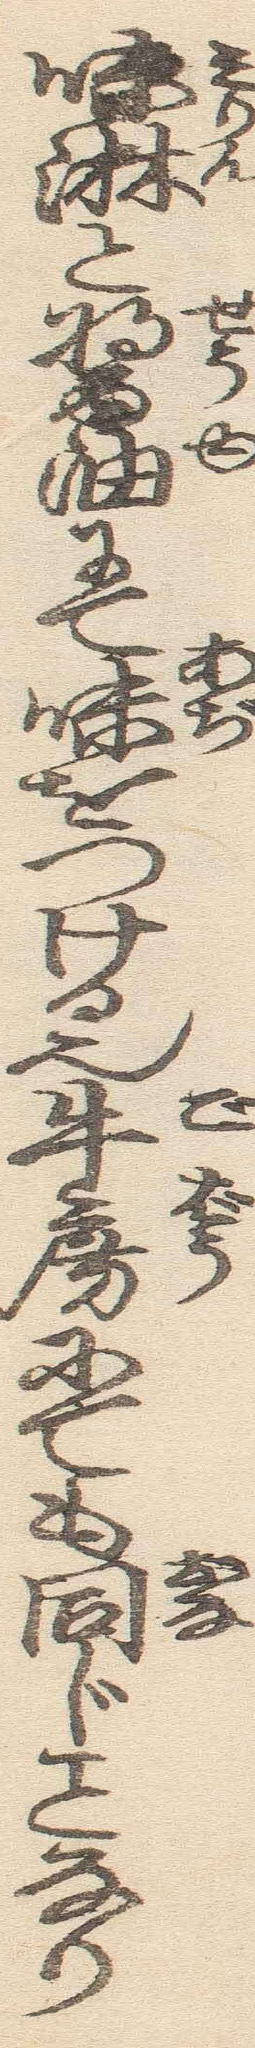味淋と醤油にて味をつける也牛房にても同じことなり
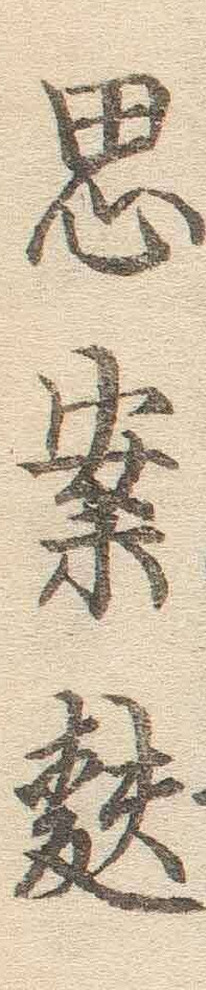思案麩

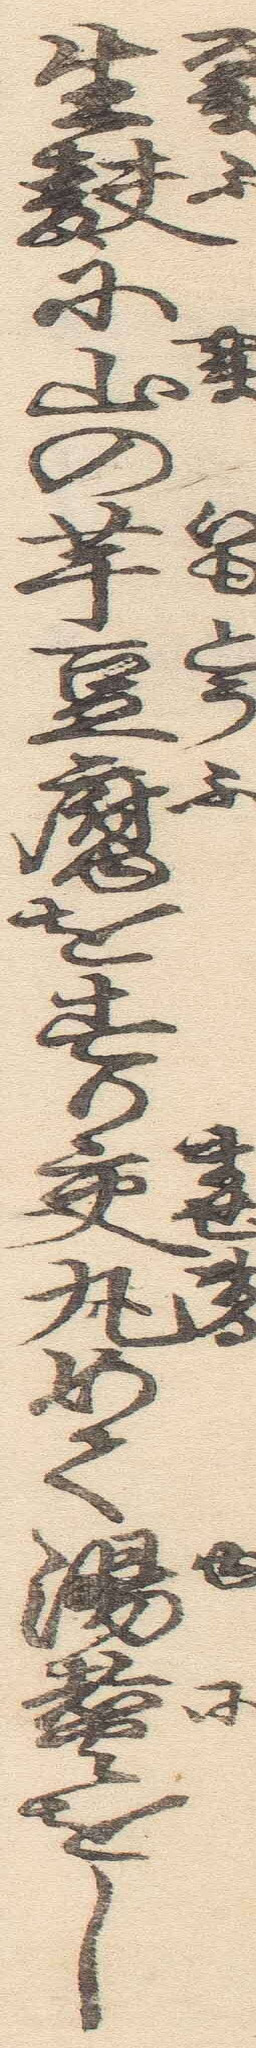生麩に山の芋豆腐をすり交丸めて湯煮をし
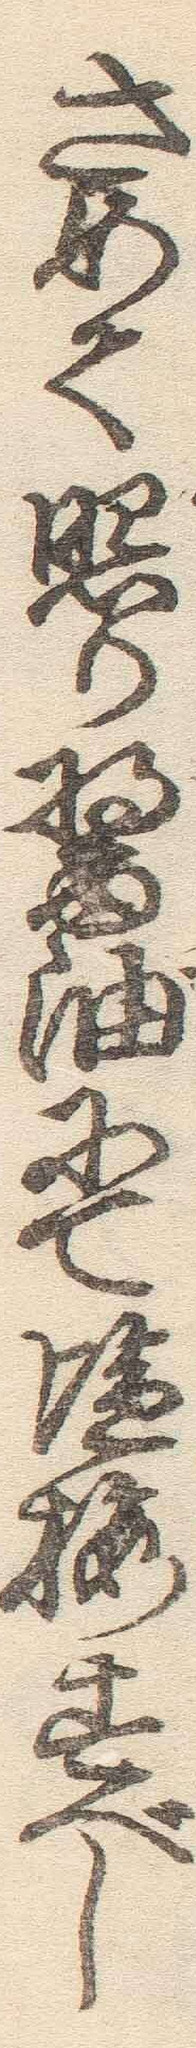さめて照り醤油にて塩梅すべし
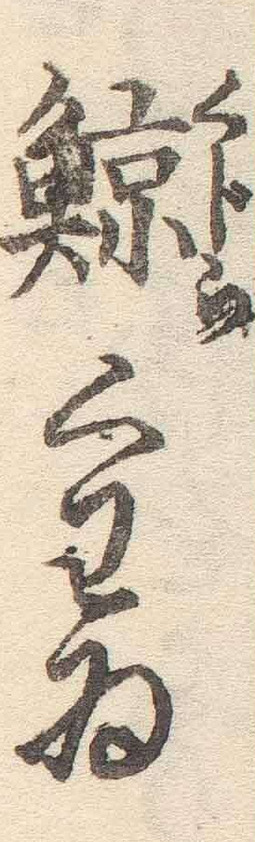鯨くわゐ
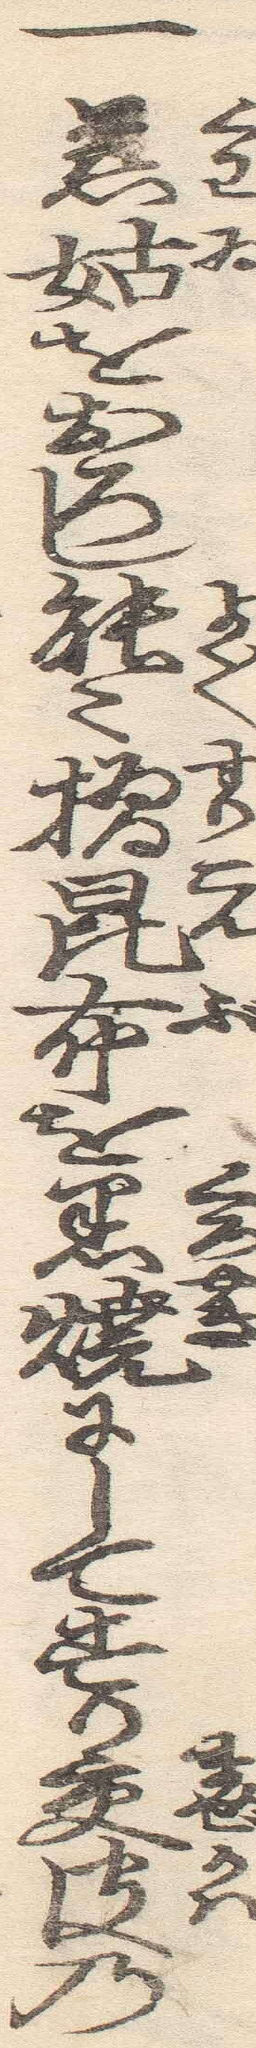一慈姑をおろし能々摺昆布を黒焼にしてすり交皮の
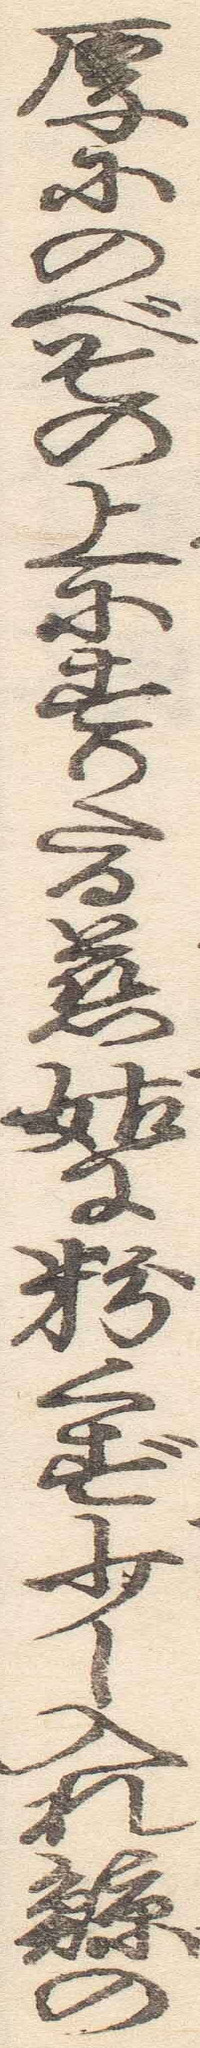厚さにのべその上にすりたる慈姑に粉くず少し入れ鯨の
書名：料理通
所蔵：東京学芸大学附属図書館 国文学研究資料館
